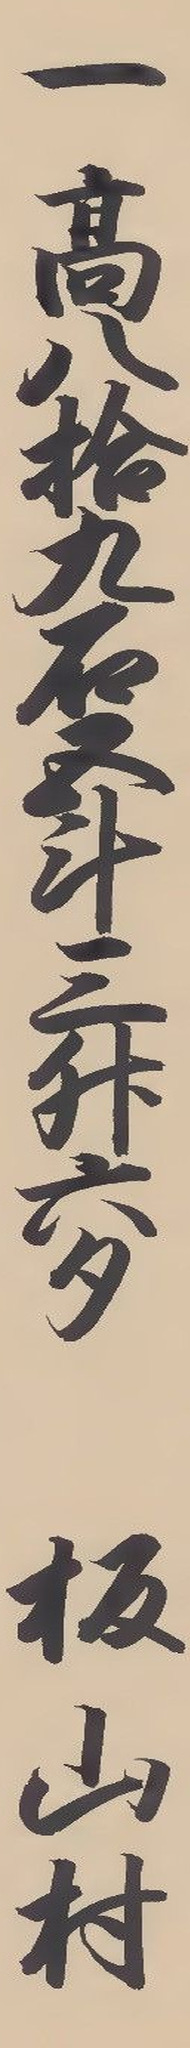一高八拾九石五斗三升六勺板山村
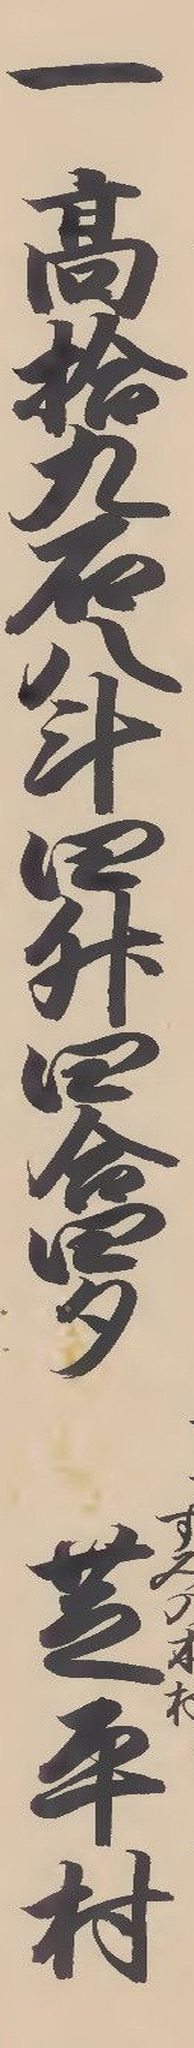一高拾九石八斗四升四合四勺芝平村
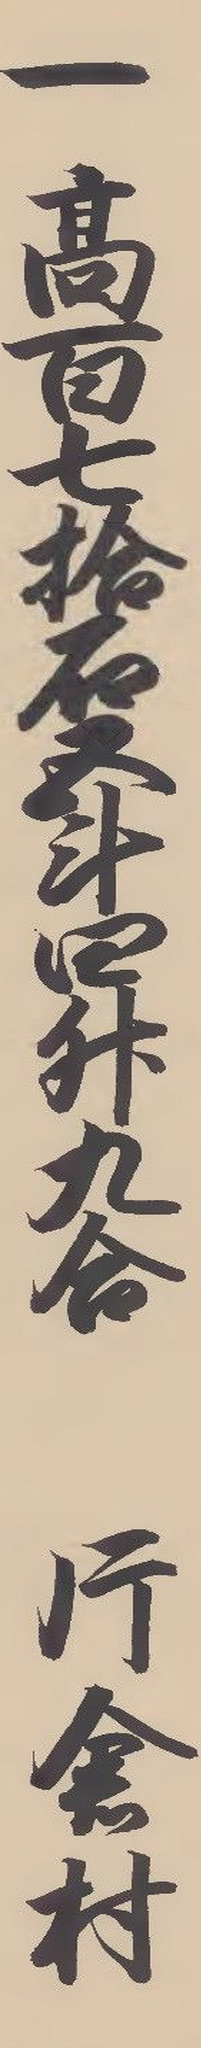一高百七拾石五斗四升九合片倉村
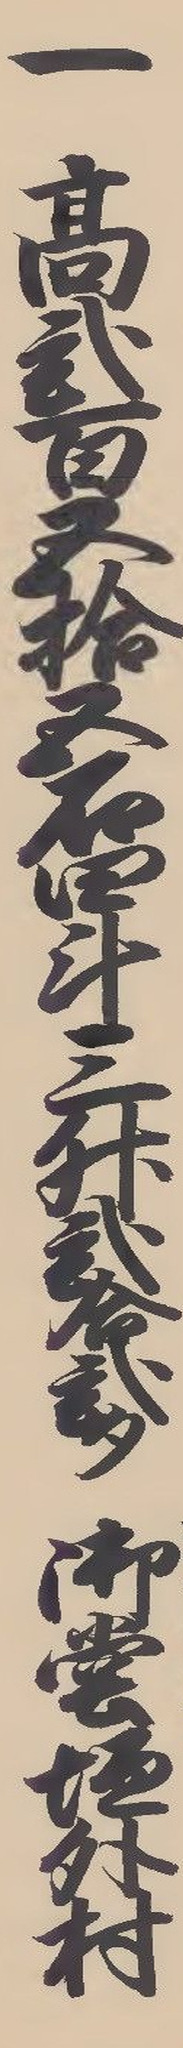一高弐百五拾五石四斗三升弐合弐勺御堂垣外村

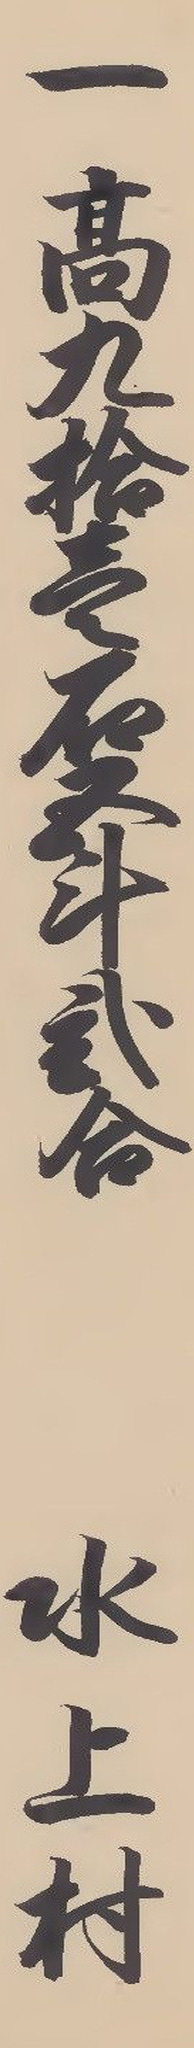一高九拾壱石五斗弐合水上村
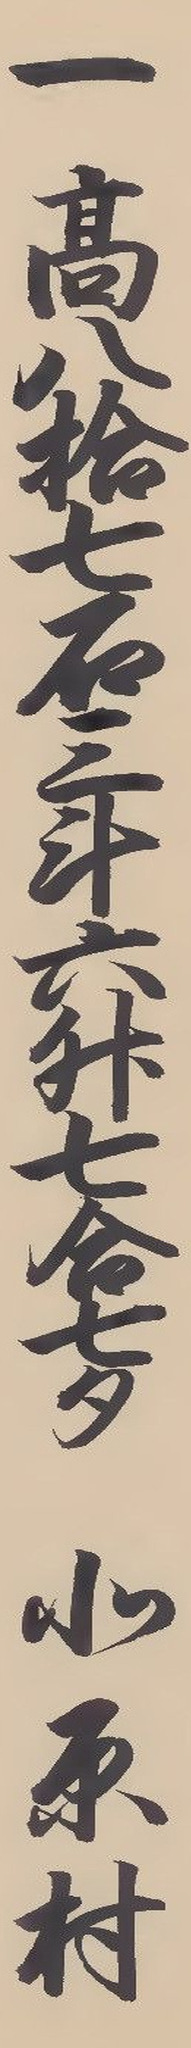一高八拾七石三斗六升七合七勺北原村
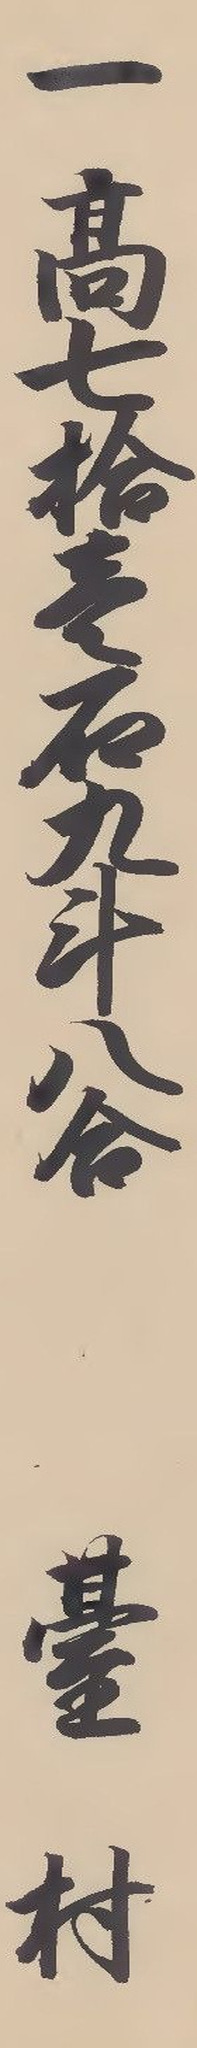一高七拾壱石九斗八合台村
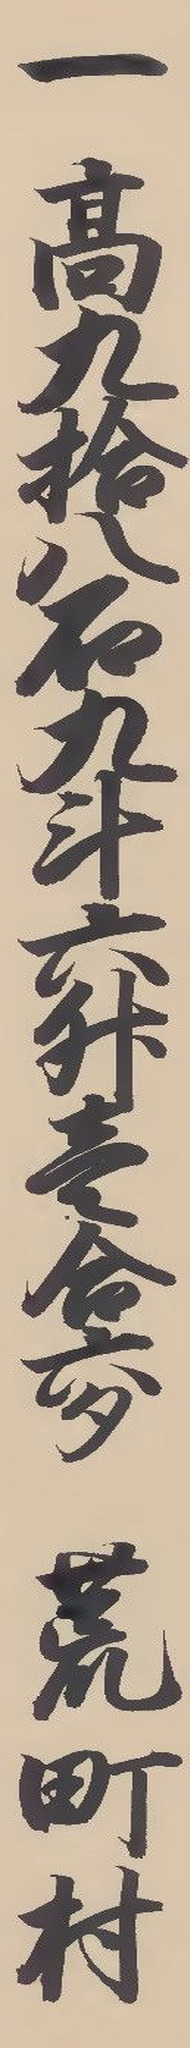一高九拾八石九斗六升壱合六勺荒町村
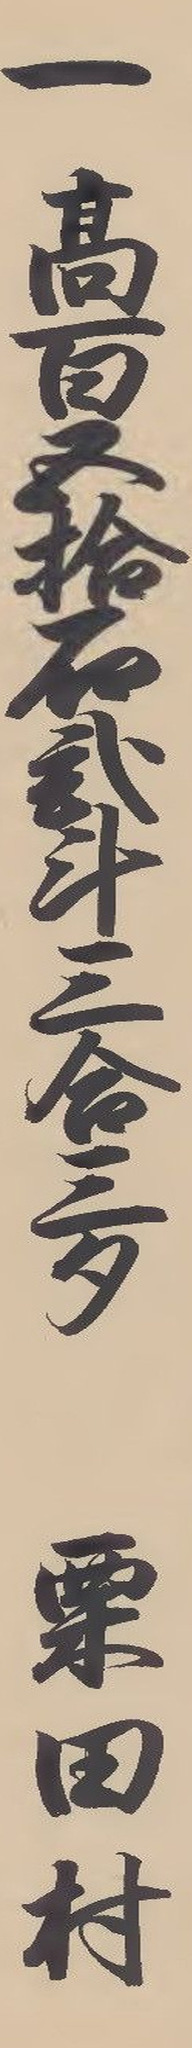一高百五拾石弐斗三合三勺栗田村
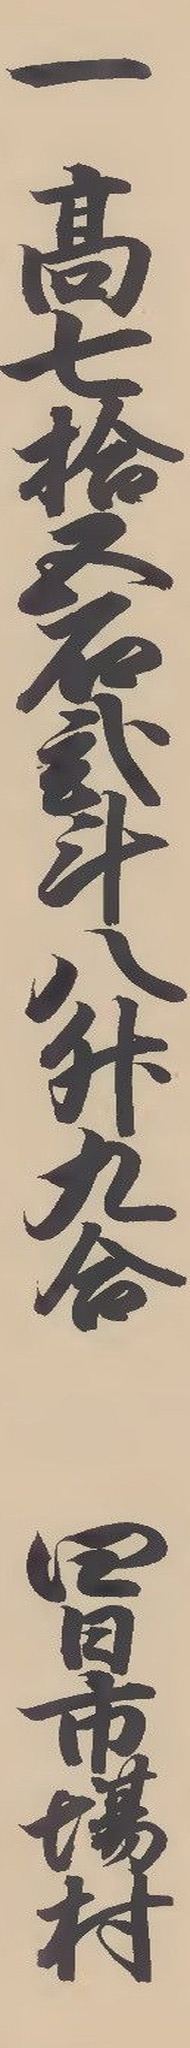一高七拾五石弐斗八升九合四日市場村
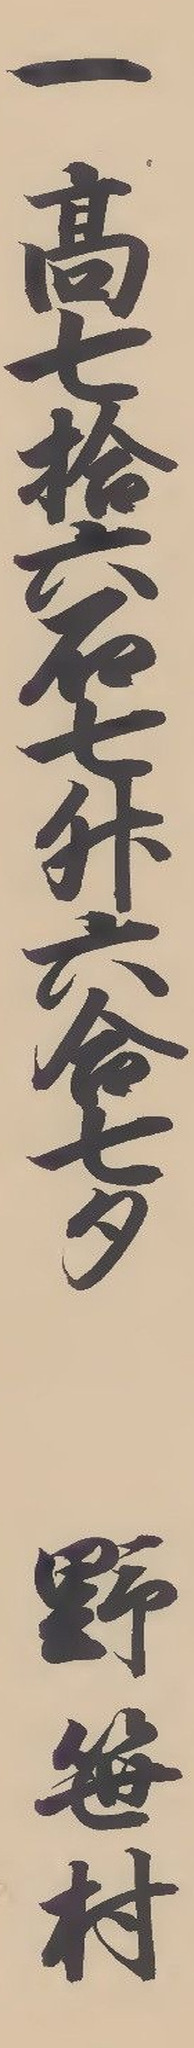一高七拾六石七升六合七勺野笹村

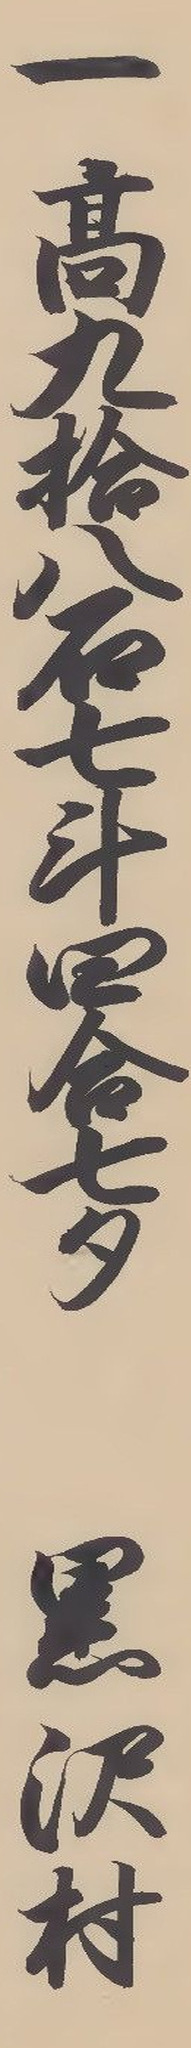一高九拾八石七斗四合七勺黒沢村
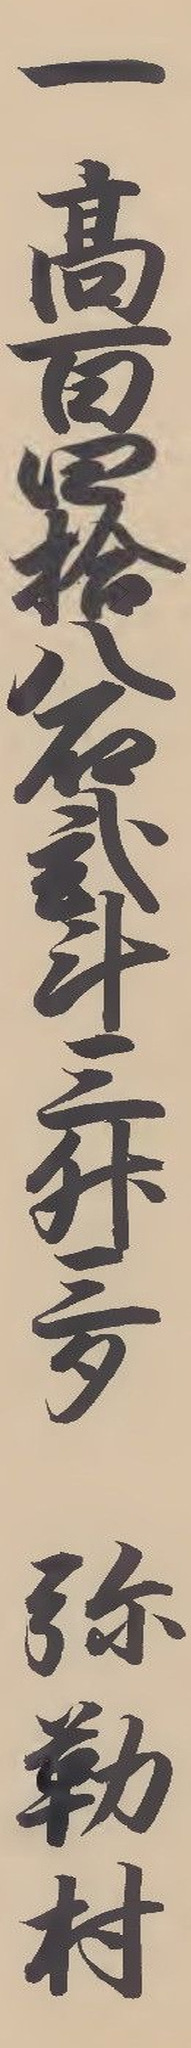一高百四拾八石弐斗三升三勺弥勒村
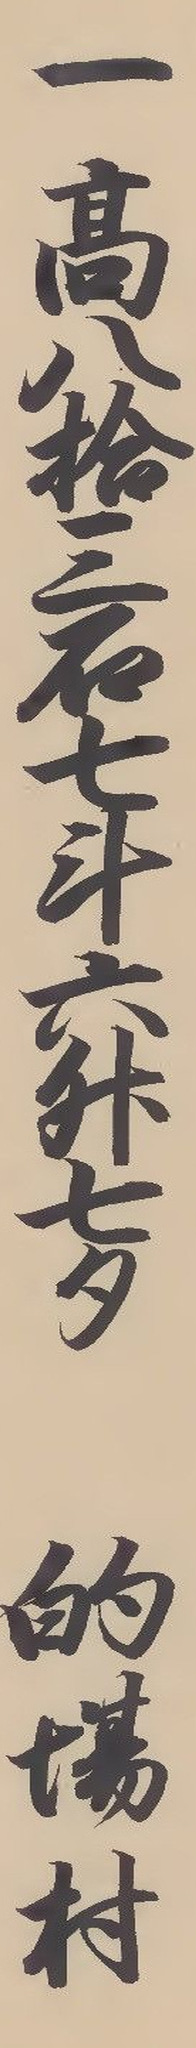一高八拾三石七斗六升七勺的場村
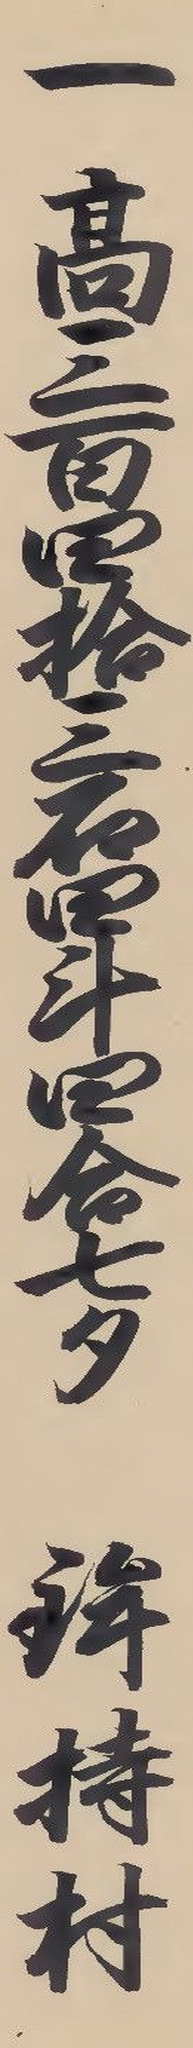一高三百四拾三石四斗四合七勺鉾持村
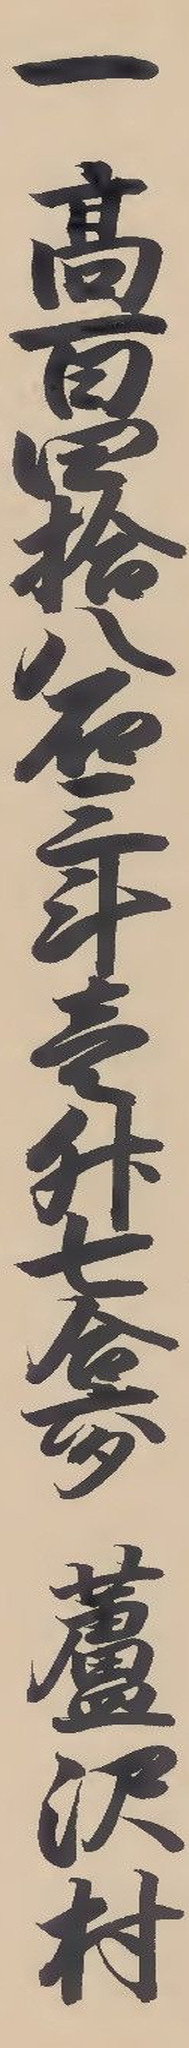一高百四拾八石三斗壱升七合六勺芦沢村
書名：信濃国郷帳
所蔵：国立公文書館 National Archives of Japan
